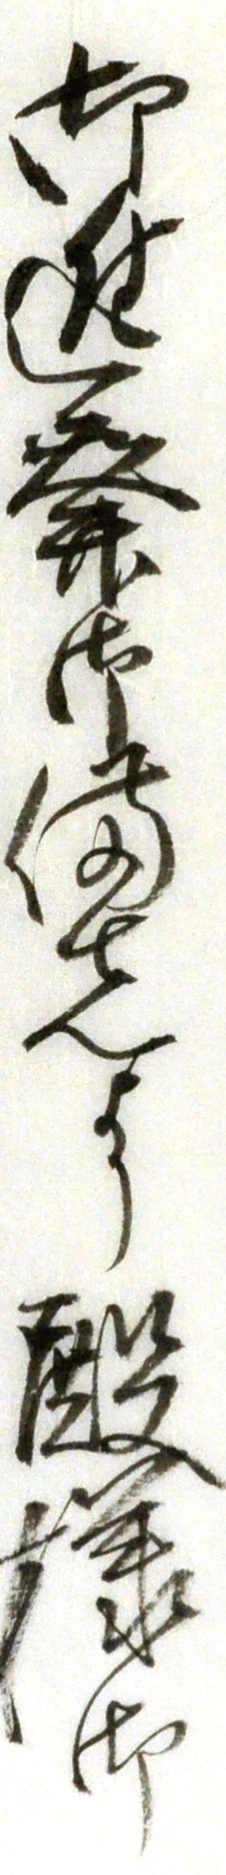御進発御備先より殿様御
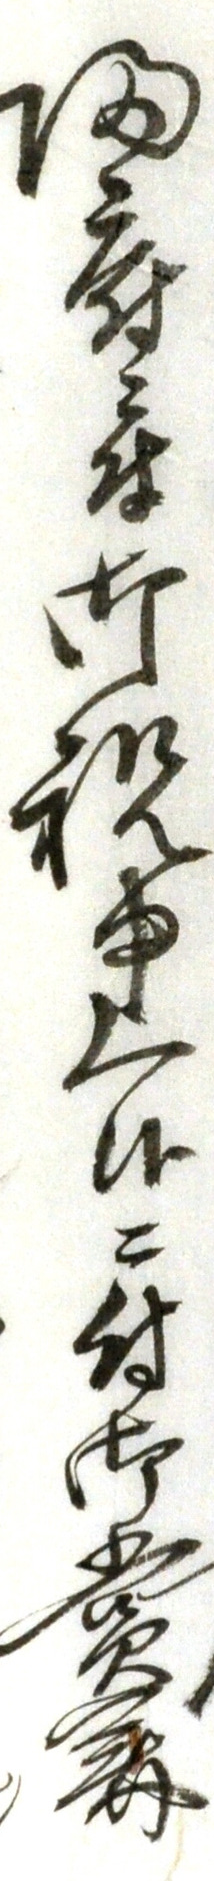帰府ニ付、御祝申上候ニ付、御賞義
